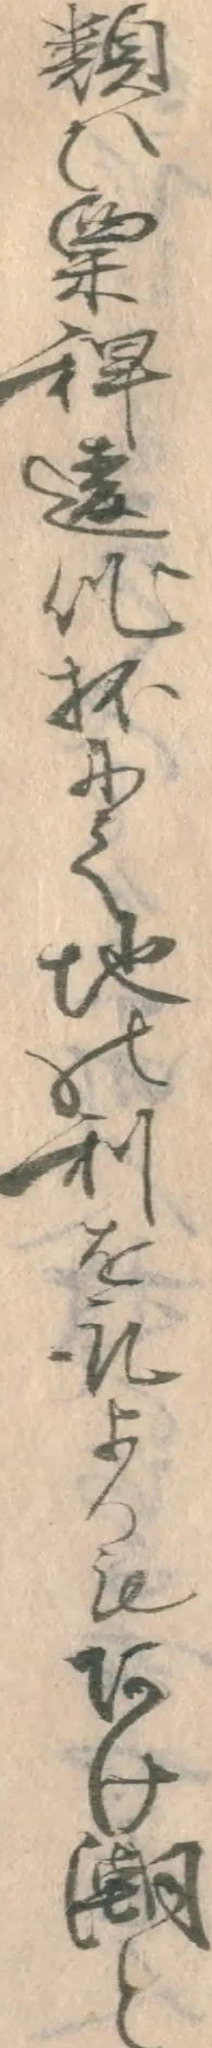類ひ粟稗違作抔にて地の利を取よりもあけ潮と
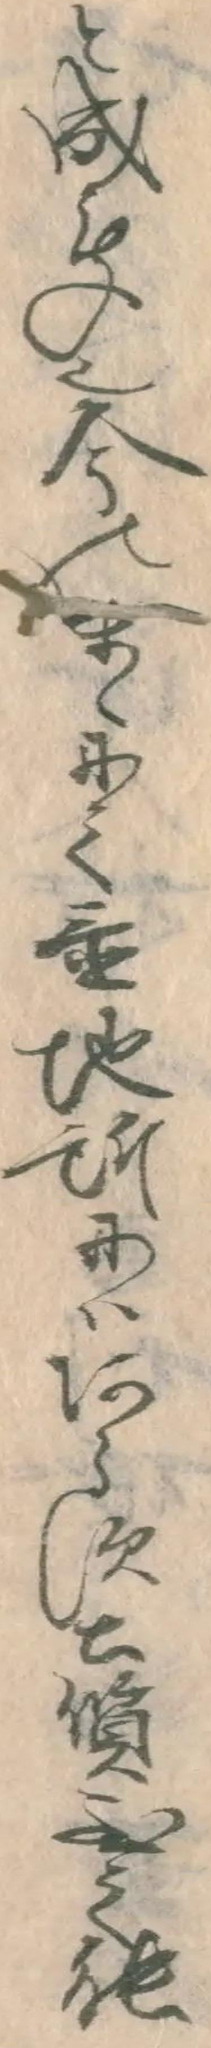と成もの也今のまゝにて置地所にはあらす土質至て能

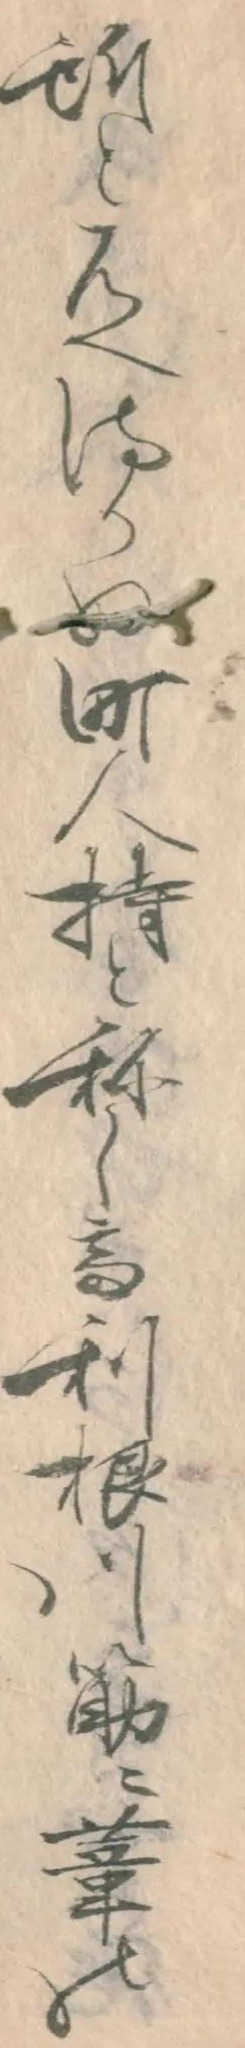歌と見へ侍りぬ町人持と称して利根川筋に葦の
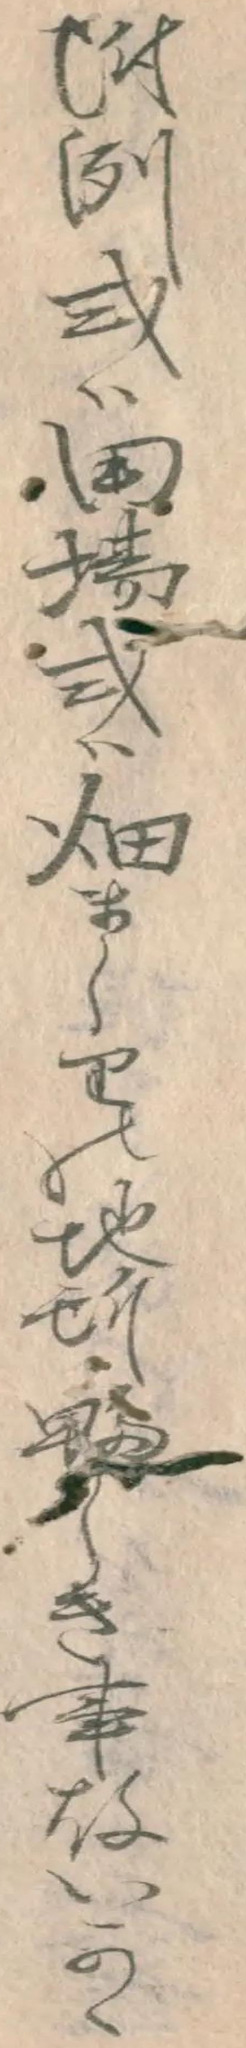附洲或は田場或は畑ましりの地所夥しき事故いかゝ
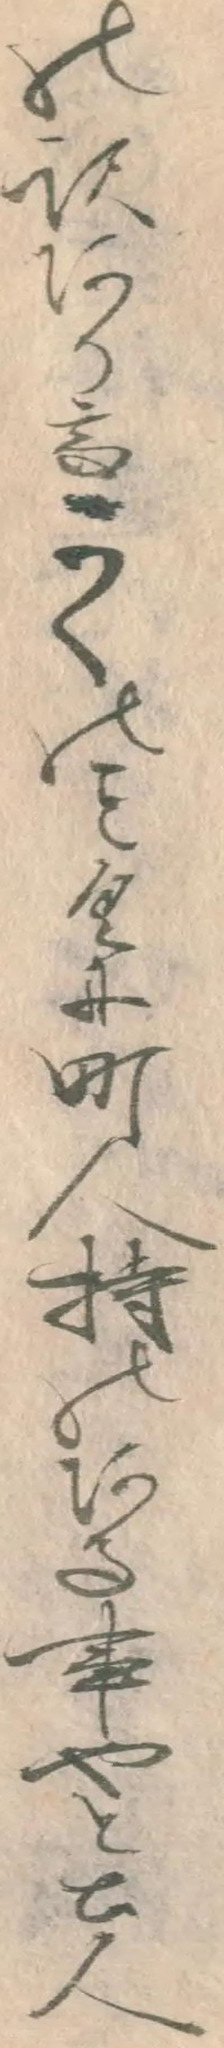の訳ありてかくのことくに町人持のある事やと土人
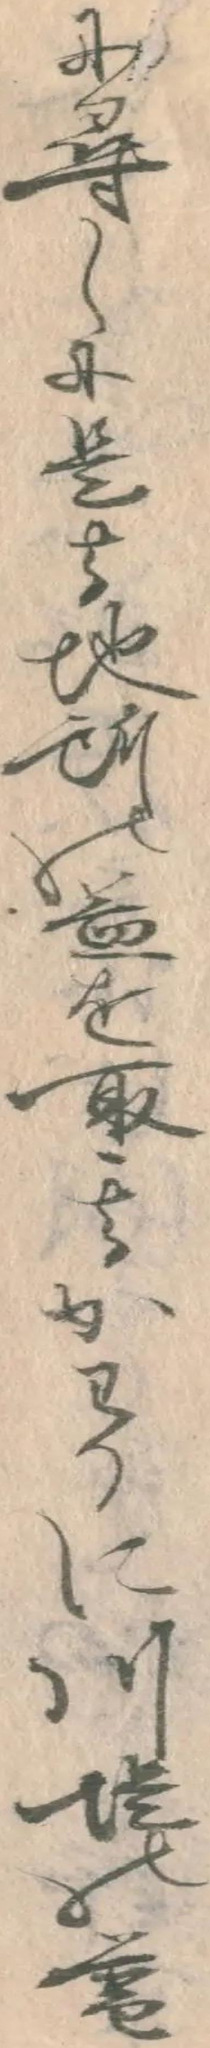に尋しに是は地所の益を取其かわりに川堤の普
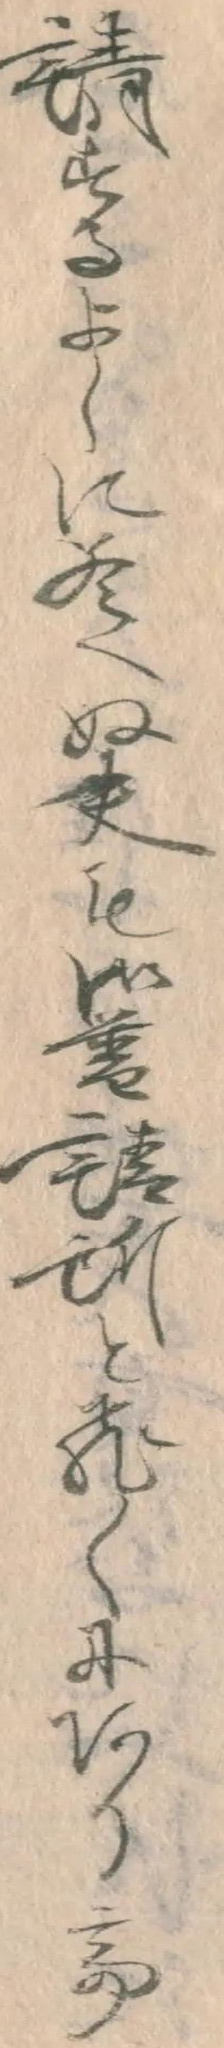請するよしに答へぬ夫も御普請所と飛〳〵にありて
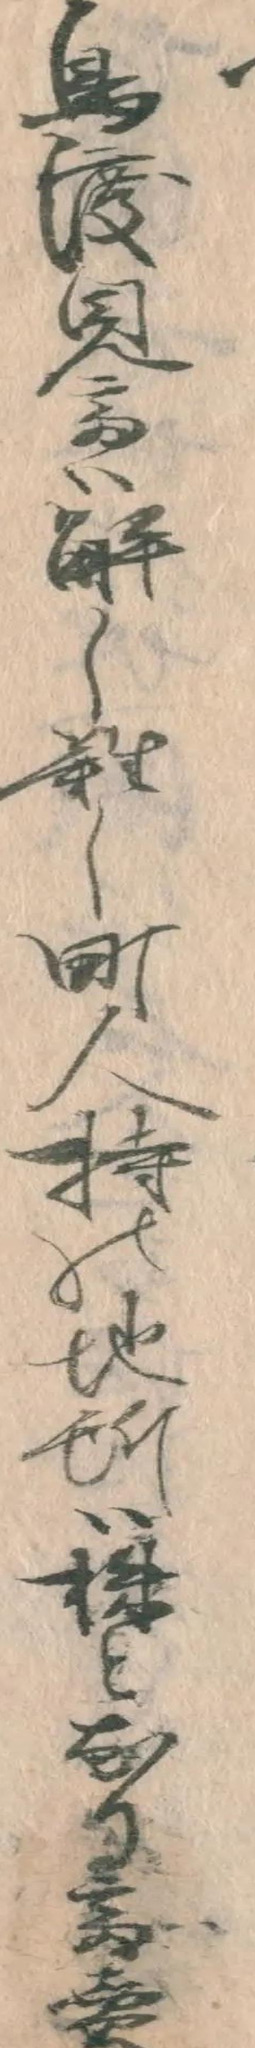鳥渡見ては解し難し町人持の地所は株となりて売
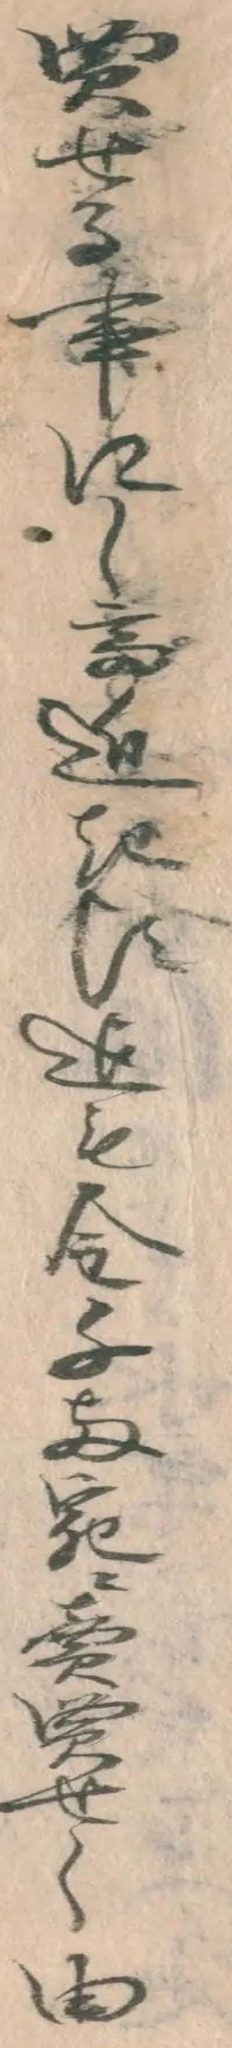買せる事にして近き頃迄も金千両宛に売買せし由
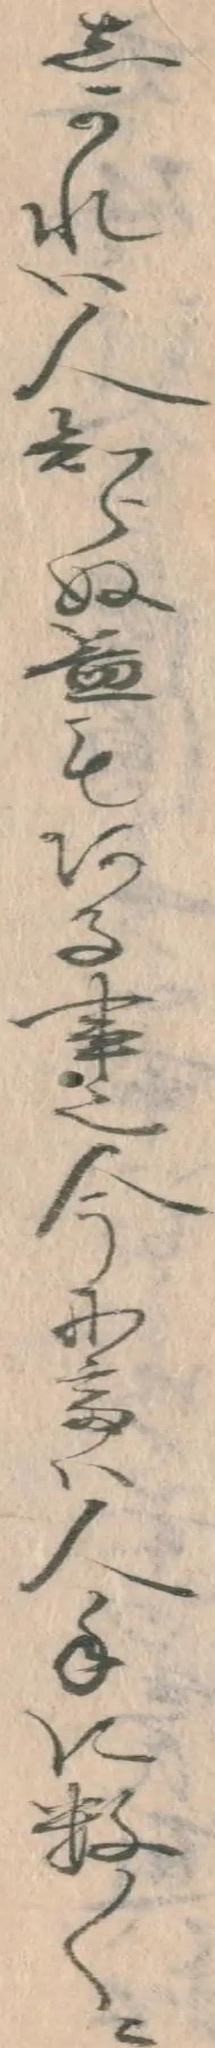しかれは人知らぬ益もある事也今に言は人手を数〳〵に
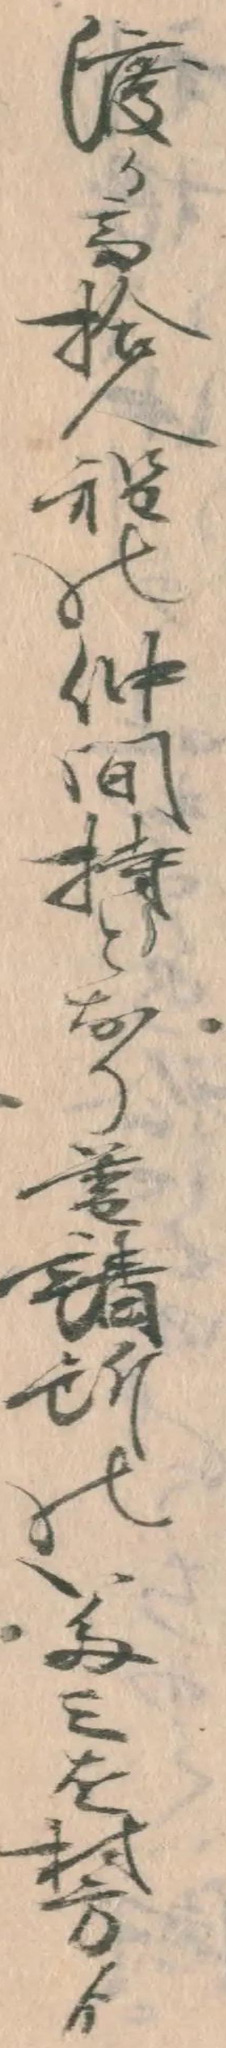渡りて拾人程の仲間持となり普請所のいたみを村方より
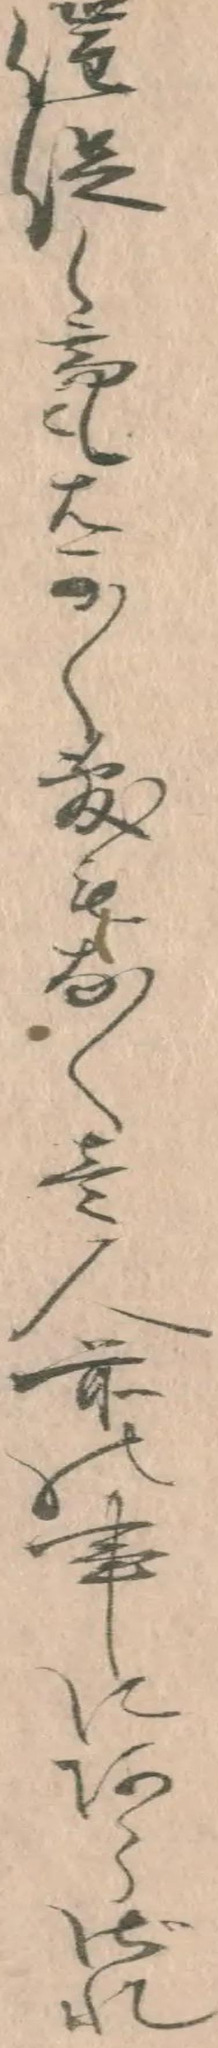催促してもはか〳〵敷もなく壱人前の事にあらざれ
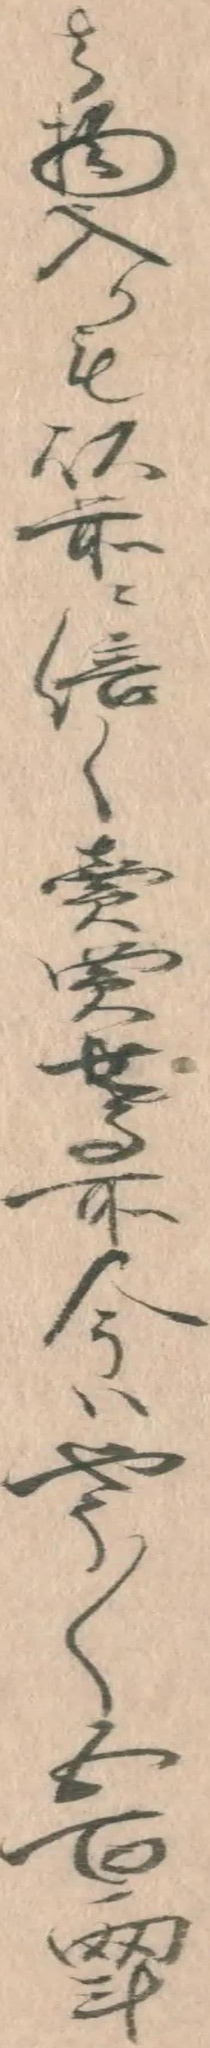は物入りも以前に倍し売買せる所今はやう〳〵五百両斗
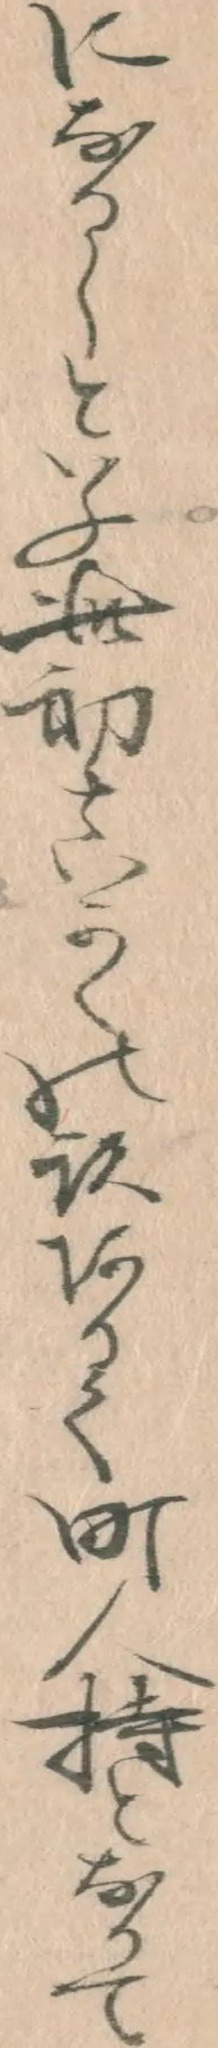になりしといふ此初はいかゝの訳ありて町人持となりて
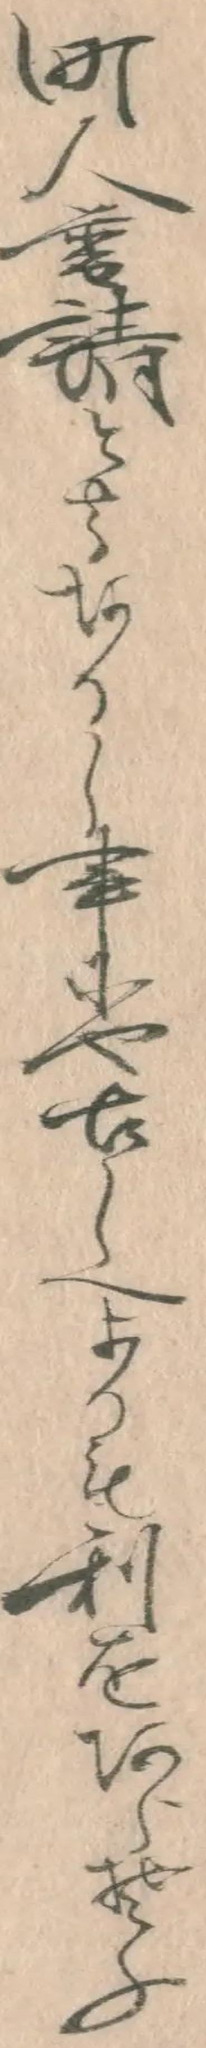町人普請とはなりし事にや古しへよりも利をあらそふ
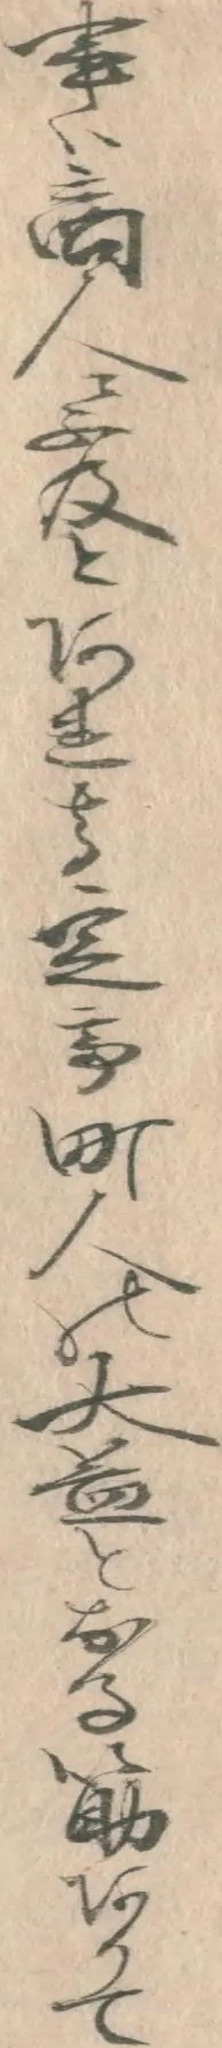事は商人に不及とあれは定て町人の大益となる筋ありて
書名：四神地名録 6巻. [4]葛飾郡
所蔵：国立国会図書館 National Diet Library, JAPAN
